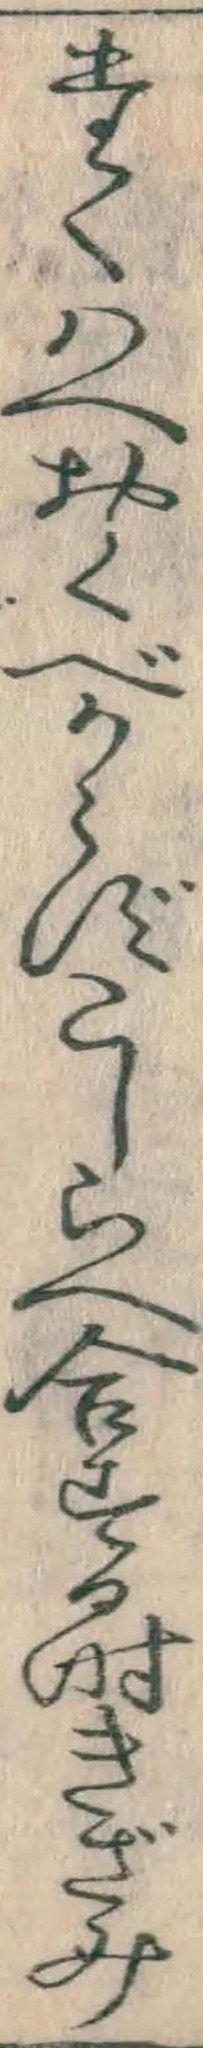たくはへおくべからずこしらへ合する時きざみ
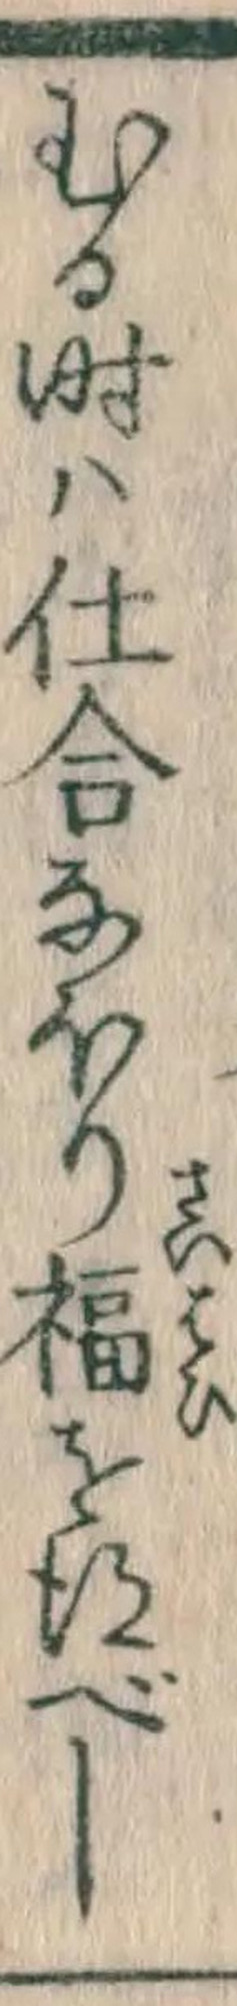むる時は仕合なほり福を得べし
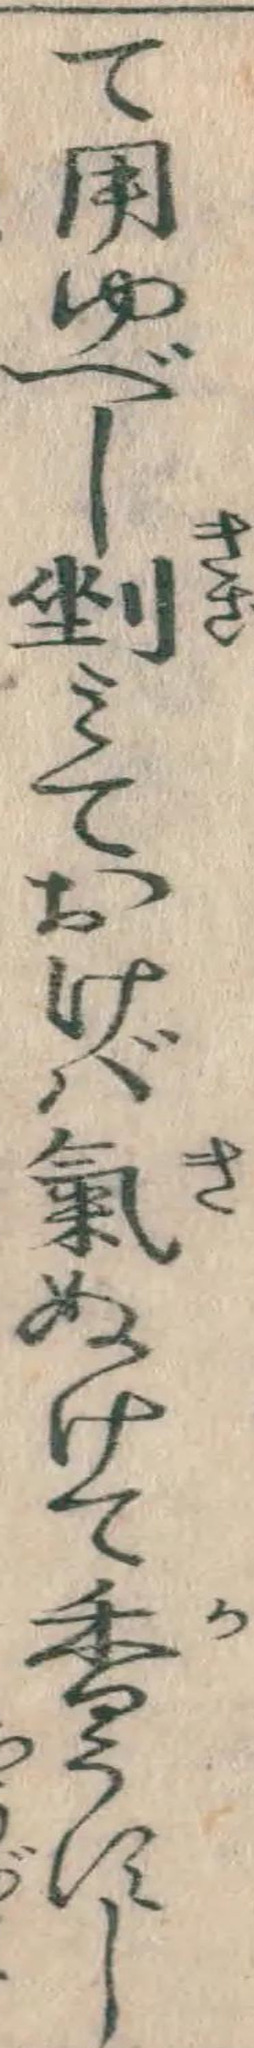て用ゆべし剉みておけば気ぬけて香うすし
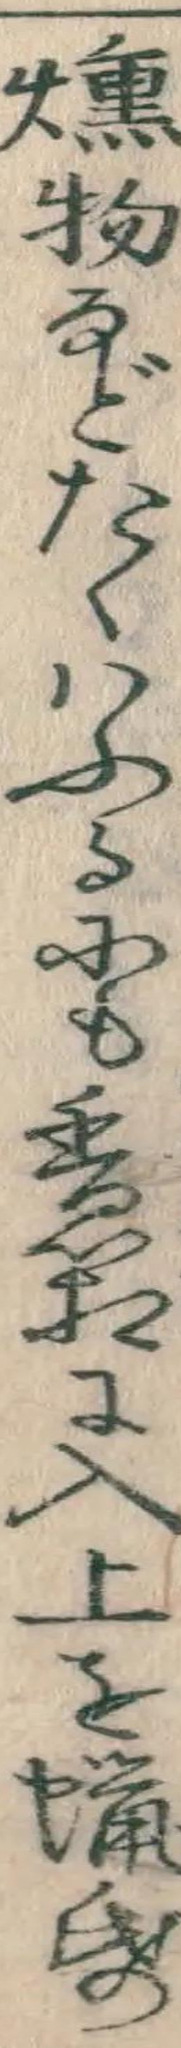燻物などたくはふるにも香箱に入上を蠟紙
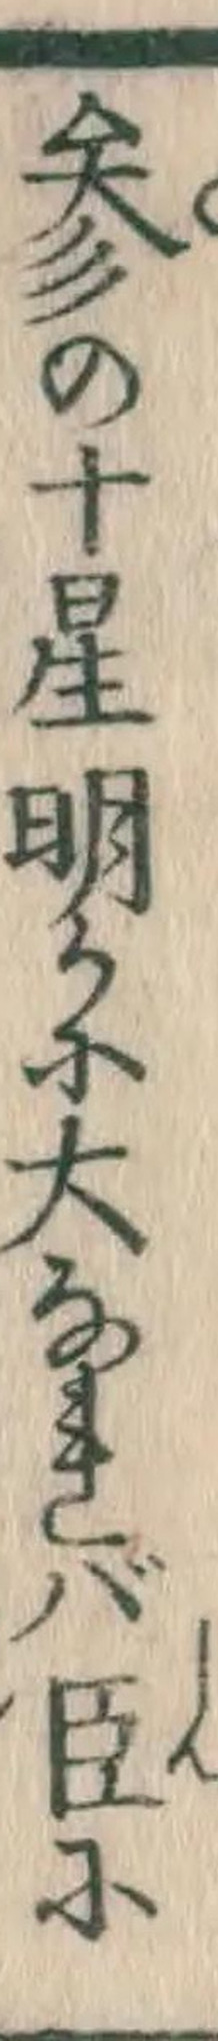参の十星明かに大なれば臣に
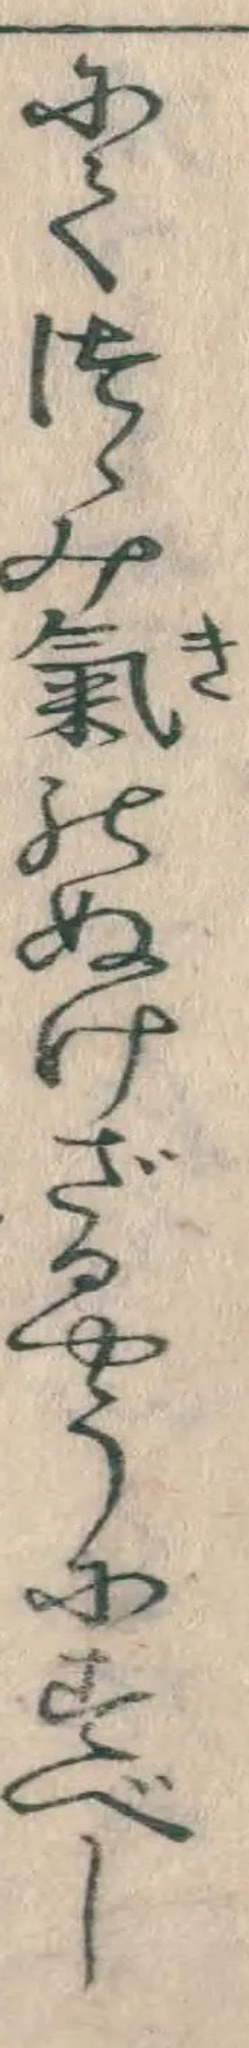にてつゝみ気のぬけざるやうにすべし
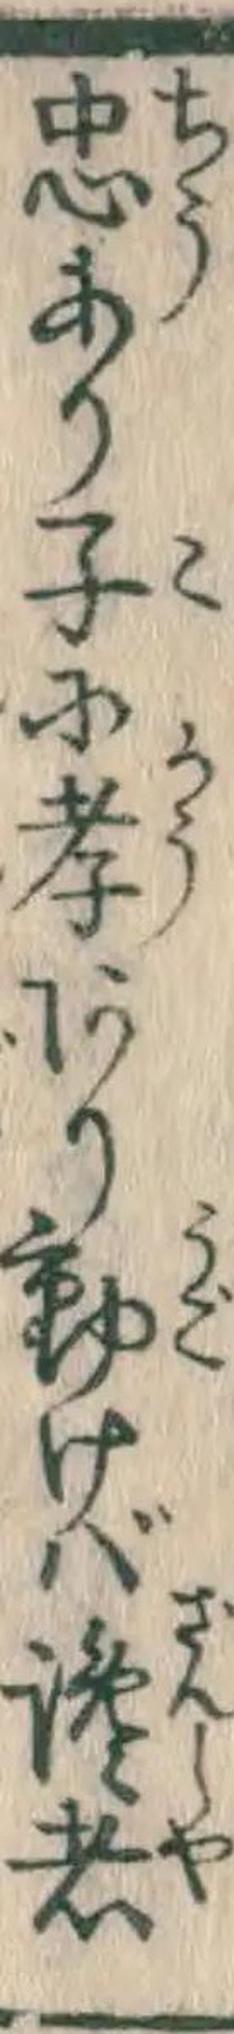忠あり子に孝あり動けば讒者
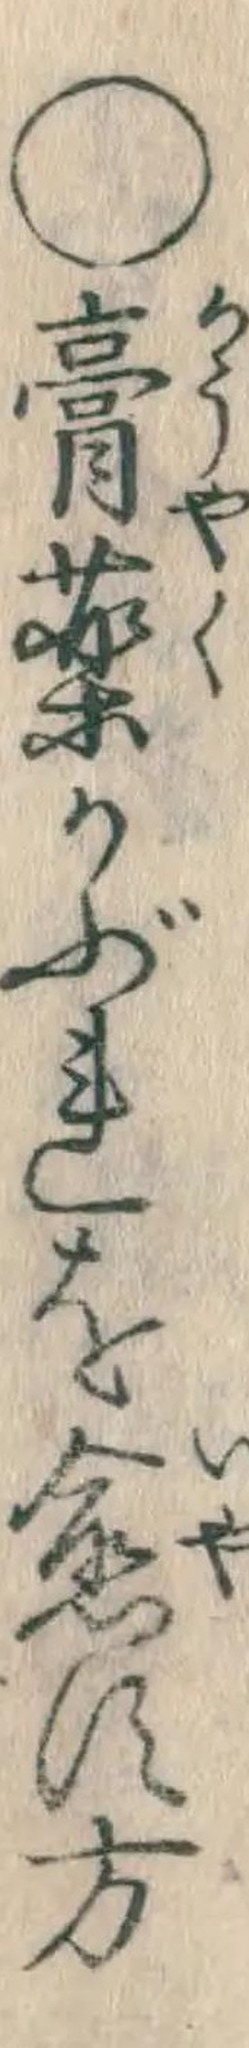○膏薬かぶれを愈す方
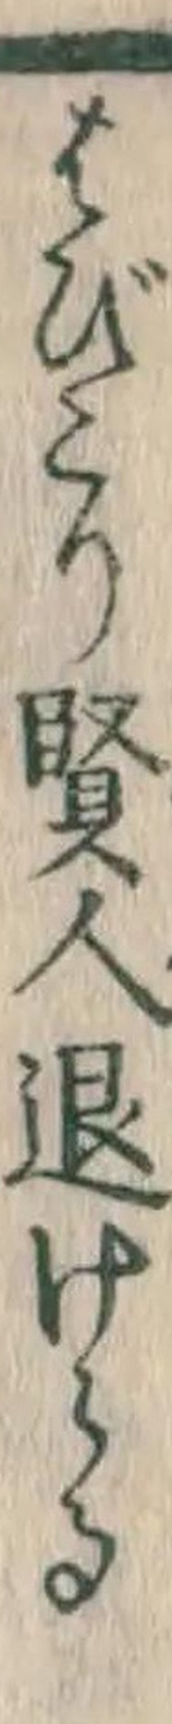はびこり賢人退けらる
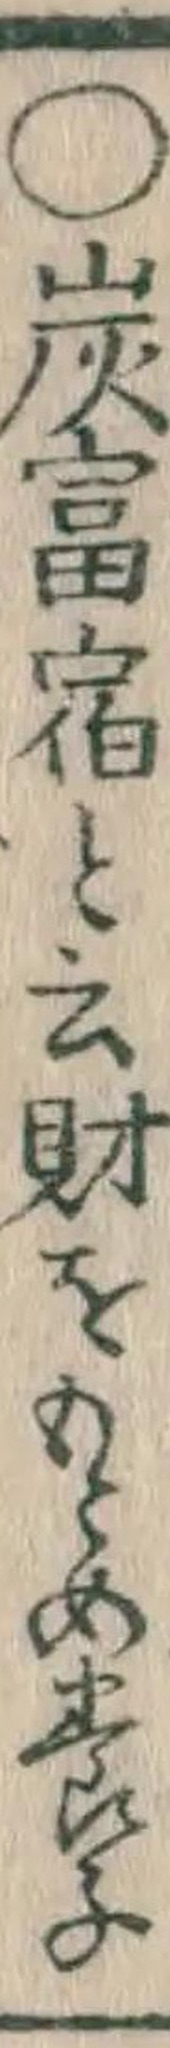○炭富宿と云財をもとめ養子
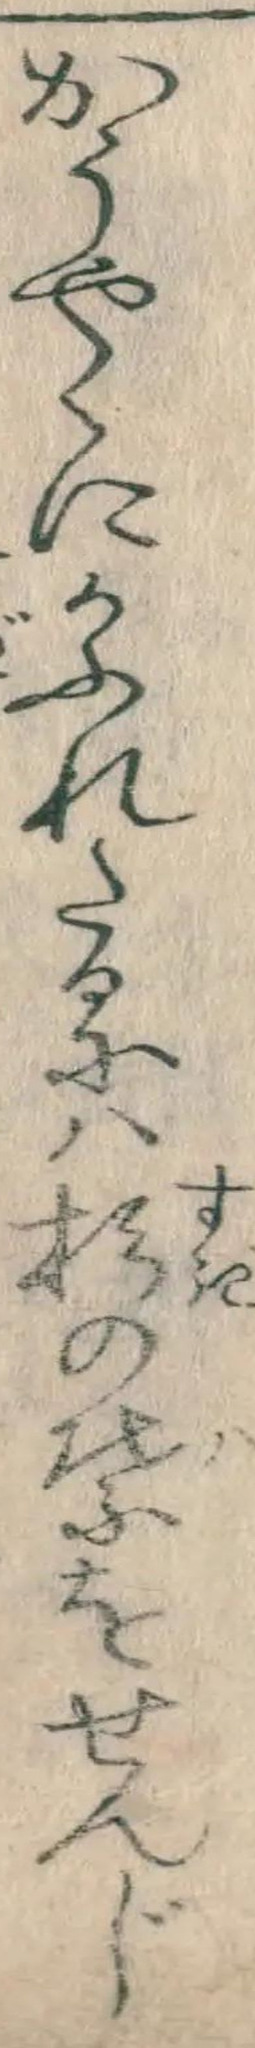かうやくにかふれたるには杉の葉をせんじ
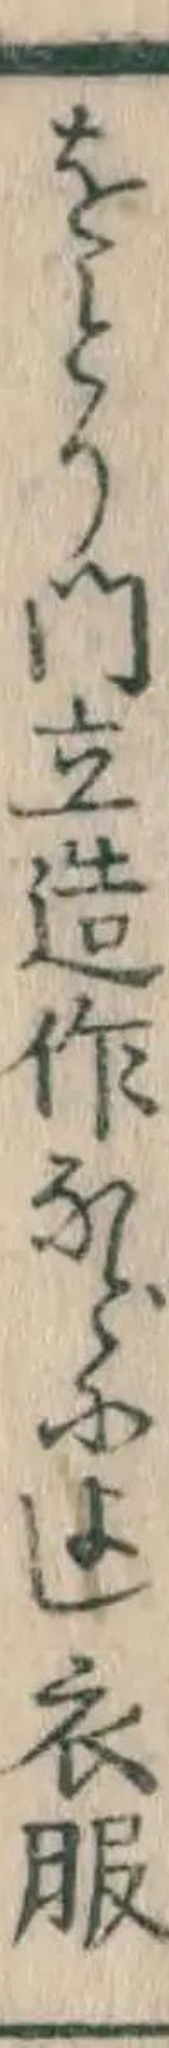をとり門立造作などによし衣服
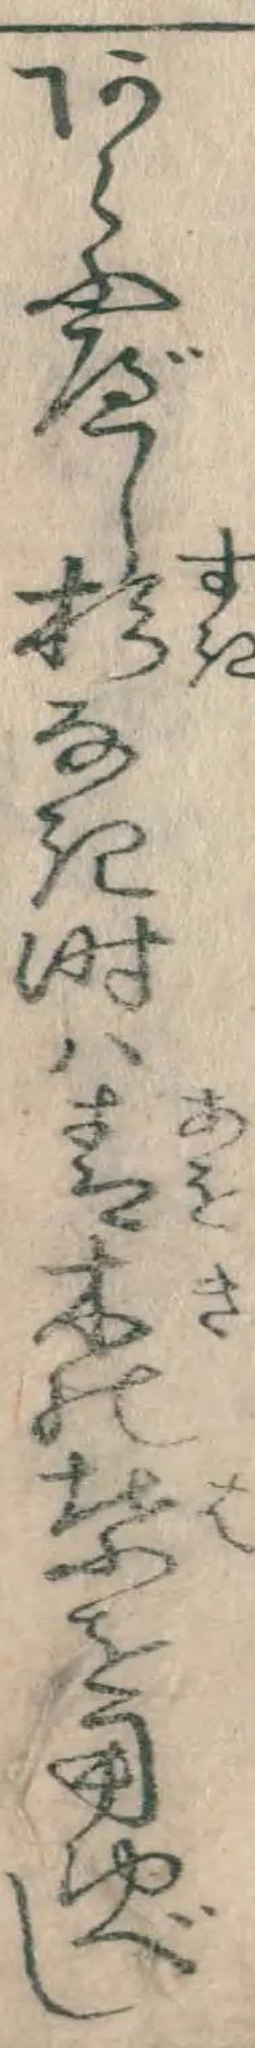あらふべし杉なき時は青木の葉を用ゆべし

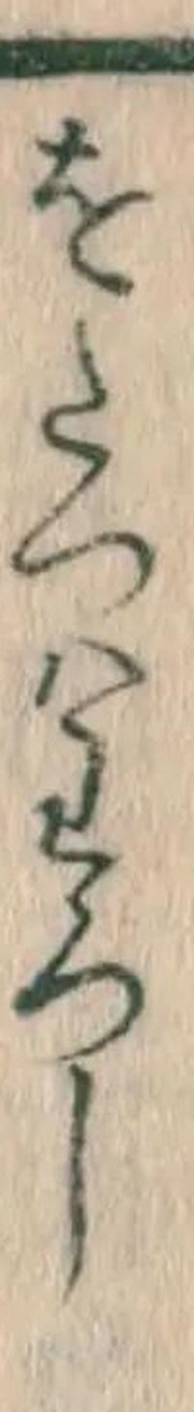をたつはわろし
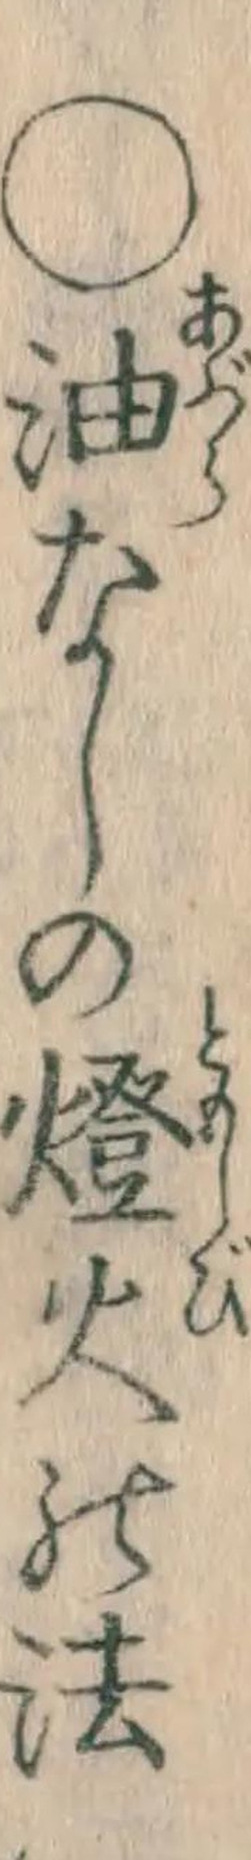○油なしの燈火の法
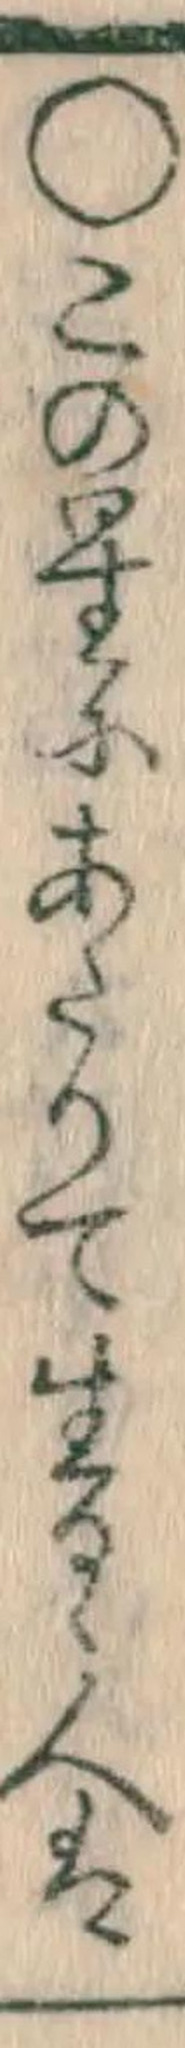○この星にあたりて生るゝ人は
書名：広益秘事大全 3巻. [2]
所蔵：国立国会図書館 National Diet Library, JAPAN
